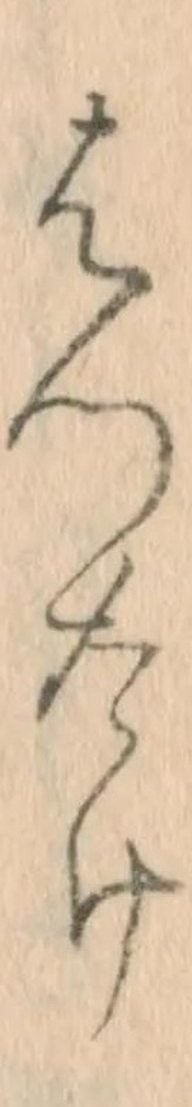はつたけ
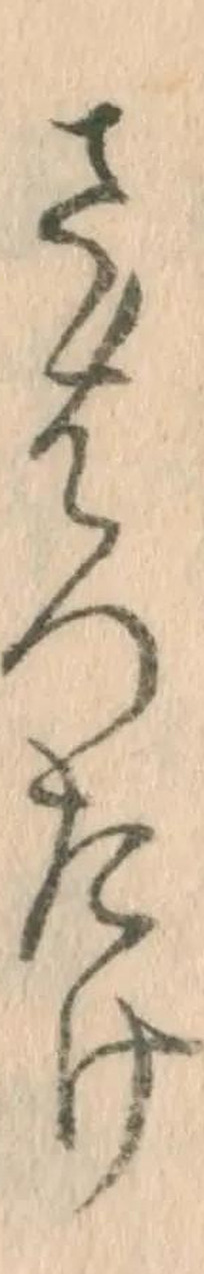さはつたけ
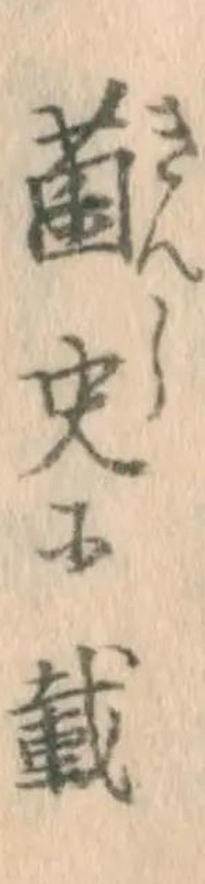菌史に載
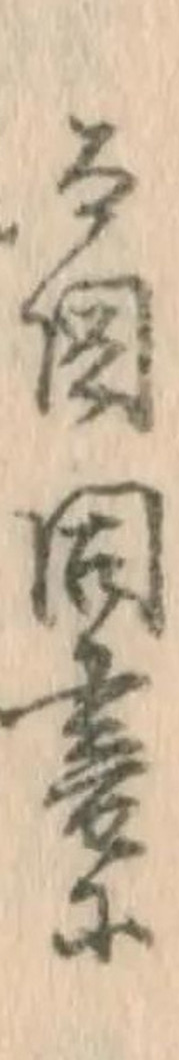る図同書に
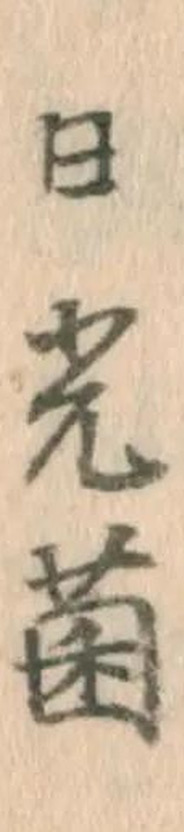日光菌
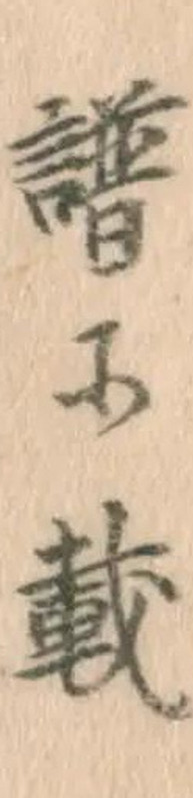譜に載
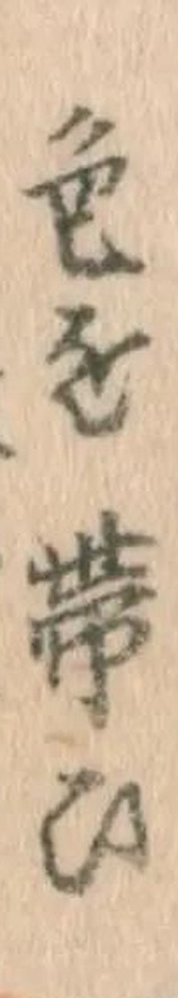色を帯ひ
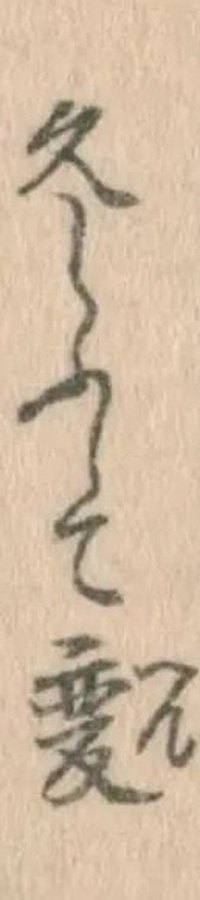久しふして変
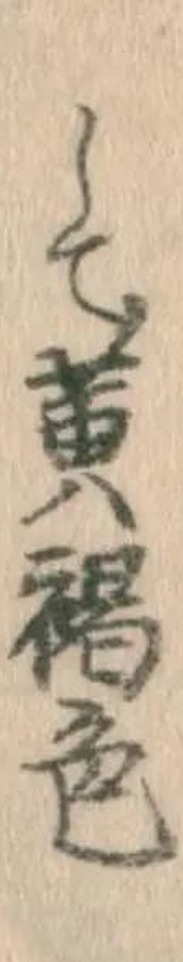して黄褐色
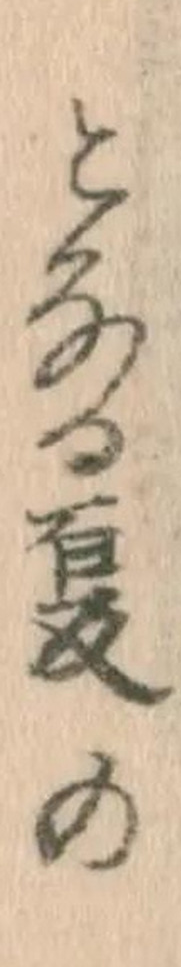となる夏の
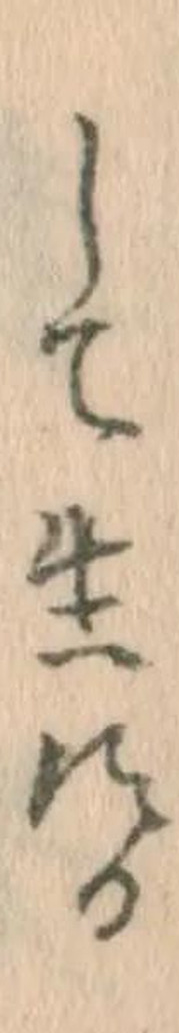して生する
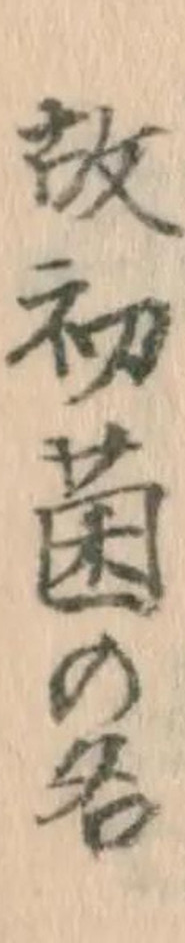故初菌の名
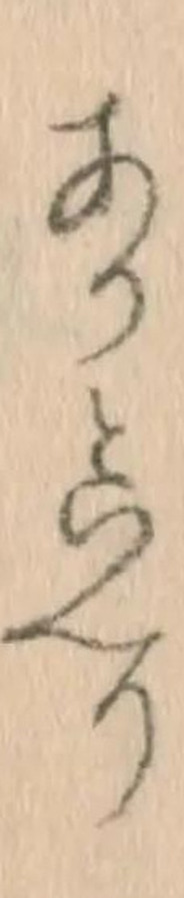ありといへり
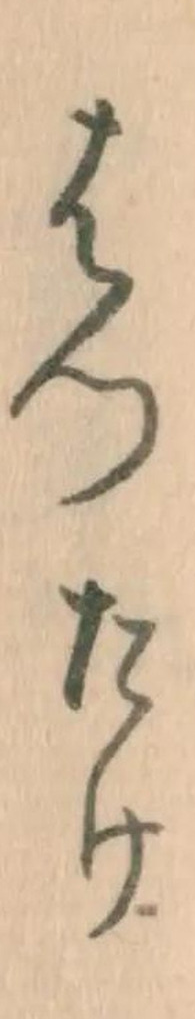はつたけ
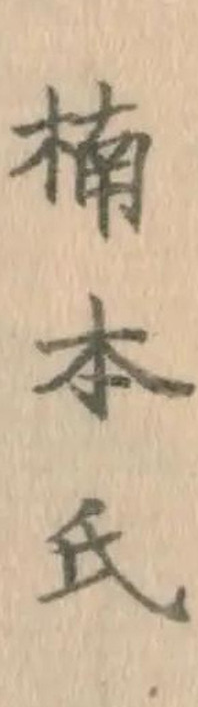楠本氏

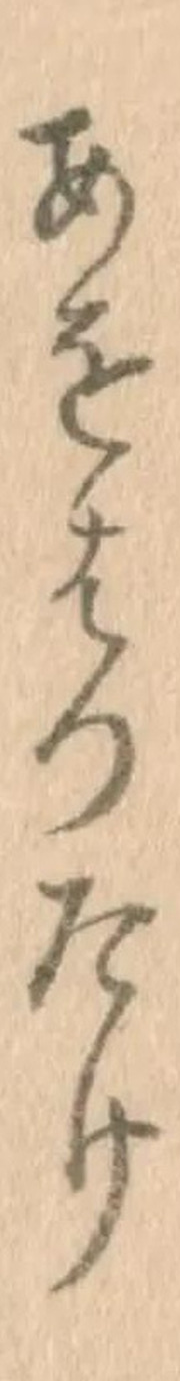あをはつたけ
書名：本草図譜. 巻55-57
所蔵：国立国会図書館 National Diet Library, JAPAN
